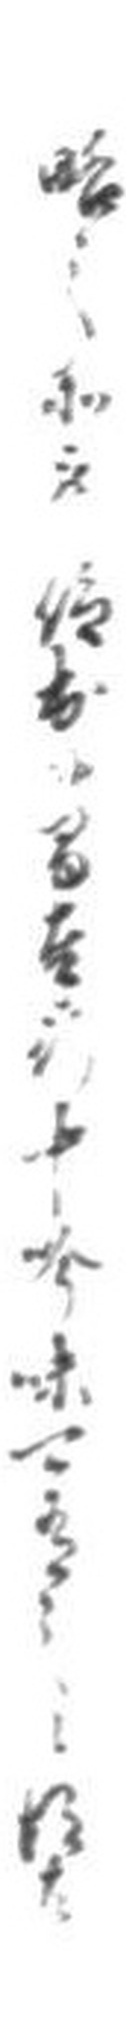略之忝被仰出候間奉行中吟味可有之候得共
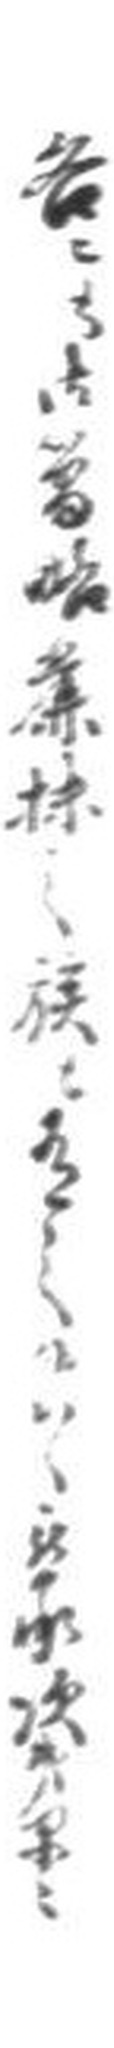各ニも御簡略麁抹之族も有之候ハゝ被承次第早々

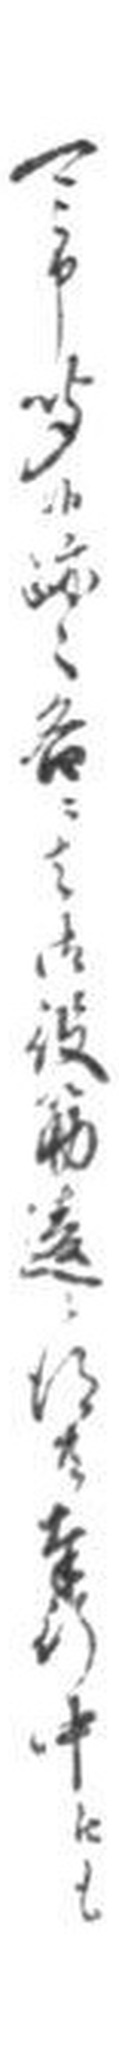可被申聞候跡々各ニは御役筋違候得共奉行中江も
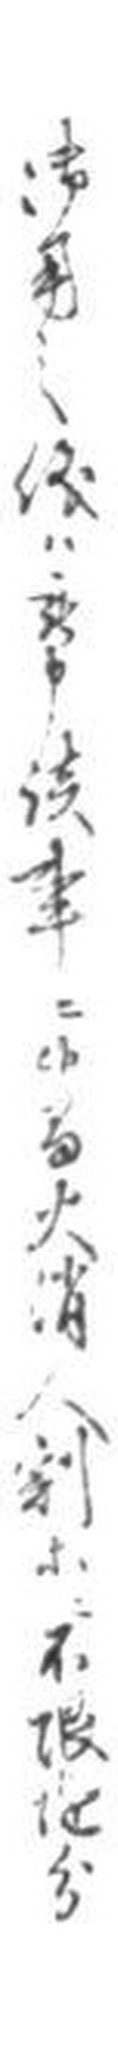御用之儀ハ被申談事ニ候間火消人割等ニ不限随分
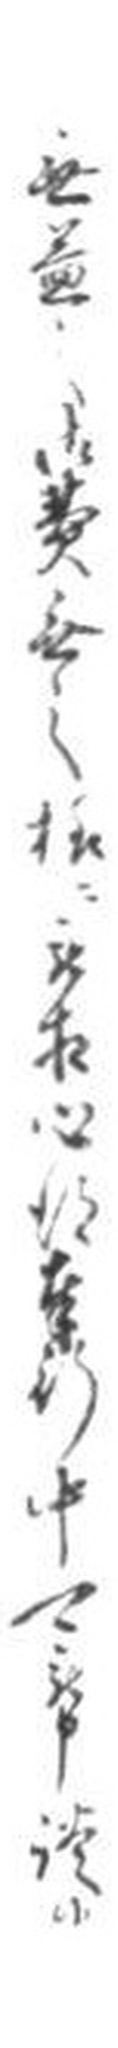無益之御費無之様ニ被相心得奉行中可被申談候
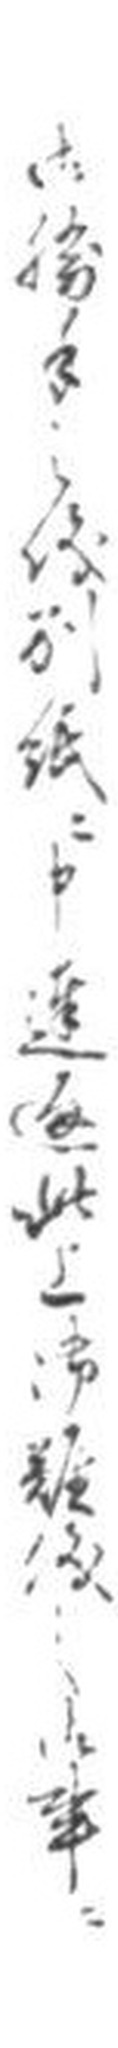御勝手之儀別紙ニ申達通此上御難儀之御事ニ
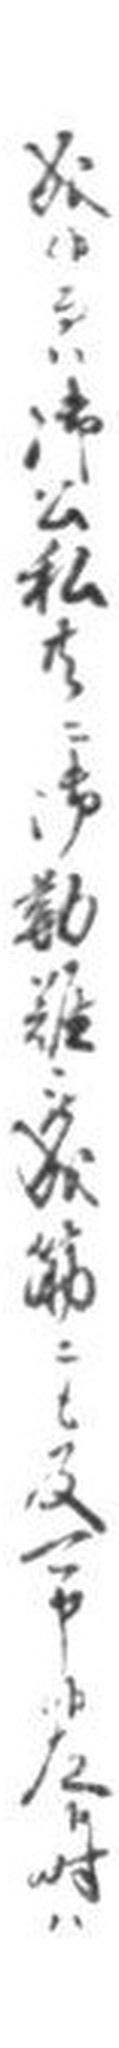成候而ハ御公私共ニ御勤難被成筋ニも及可申候左候時ハ
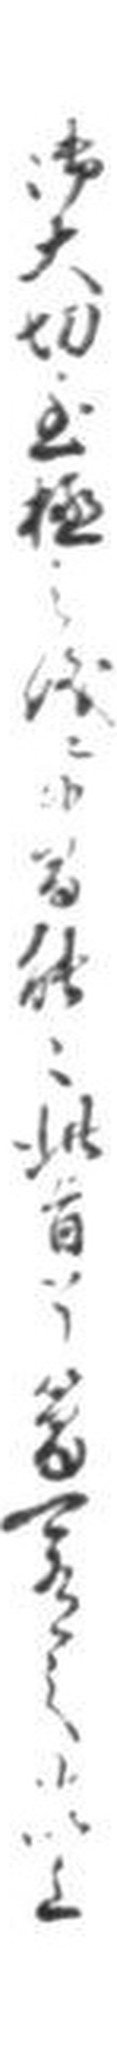御大切至極之儀ニ候間能々此旨了簡可有之候以上
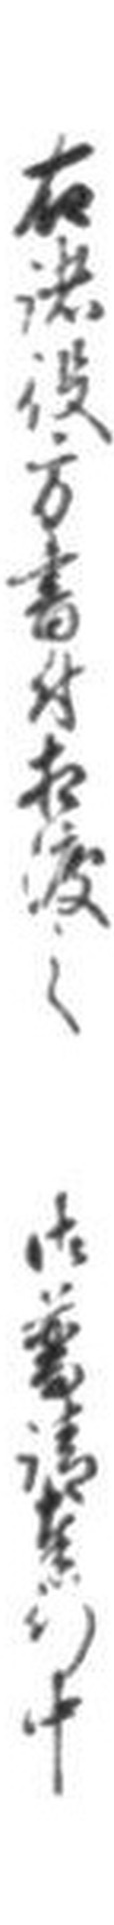右諸役方書付相渡之御普請奉行中
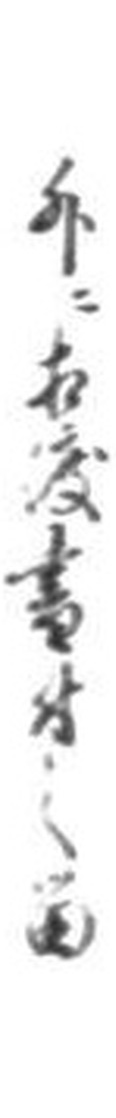外ニ相渡書付之留
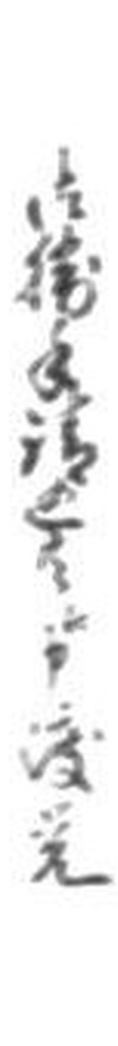御勝手請込共江申渡覚
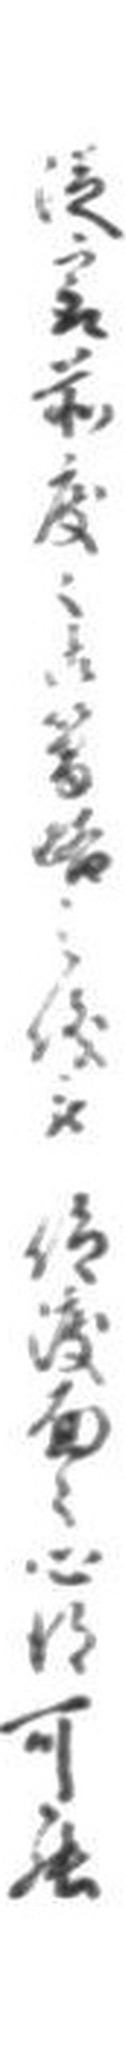従最前度々御簡略之儀被仰渡面々心得可罷
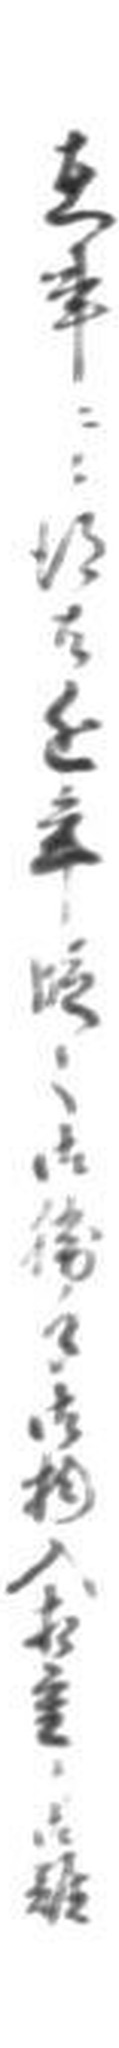在事ニ候得は近年段々御勝手御物入相重も御難
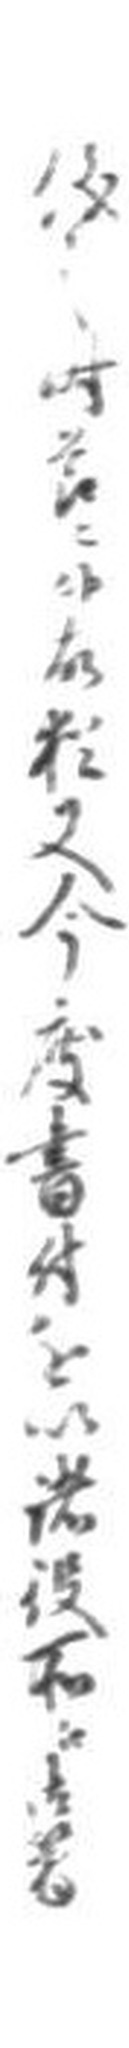儀之時節ニ候故猶又今度書付を以諸役所江御簡
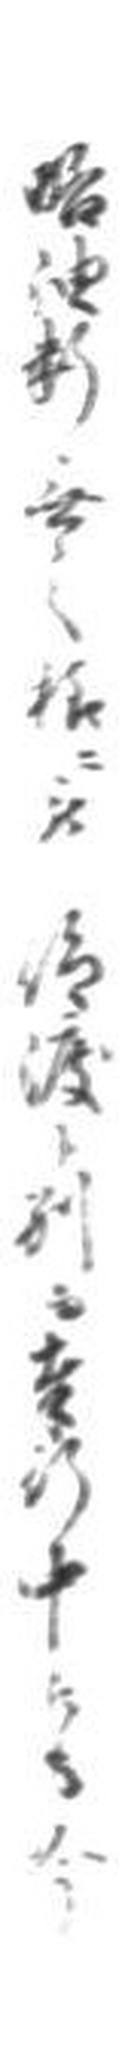略油断無之様ニ被仰渡候別而奉行中江も吟
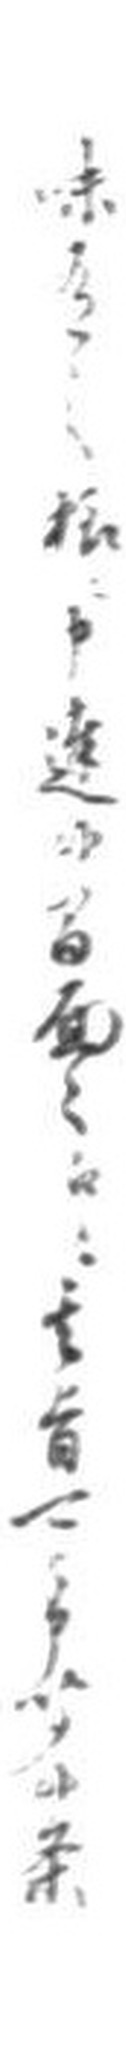味有之様ニ申達候間面々江も其旨可被申聞候条
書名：家譜 三十九 宗矩公 享保十年
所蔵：福井県文書館 Fukui Prefectural Archives
